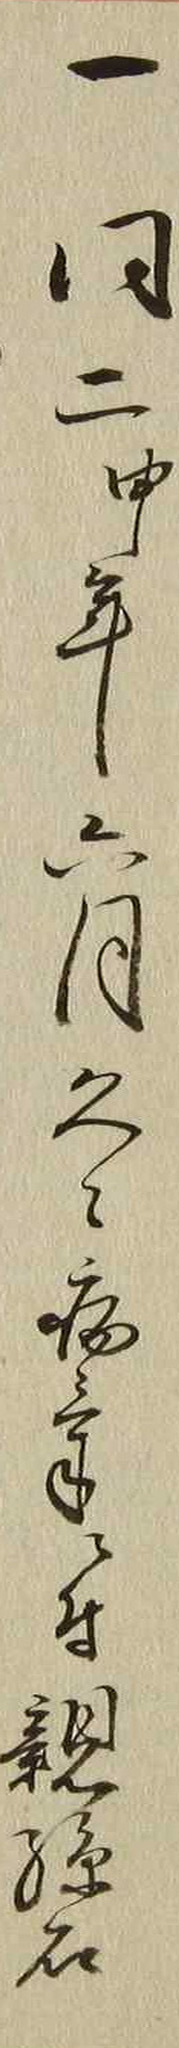一同二申年六月久々病気ニ付親孫石
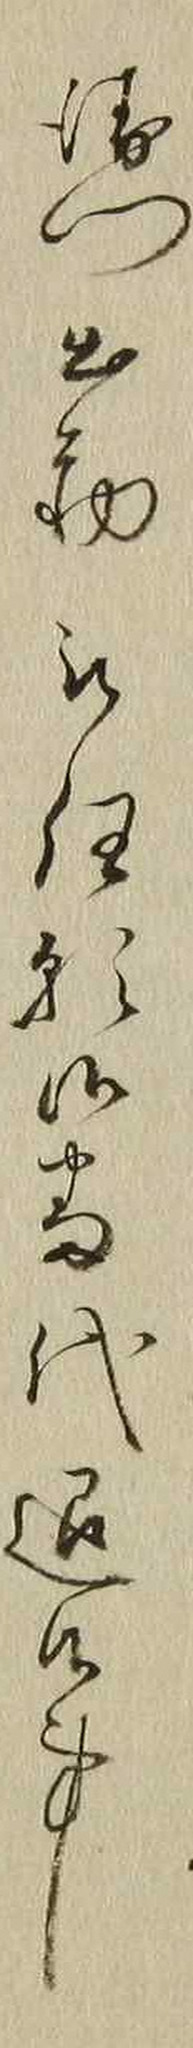衛門出勤被任願御番代退候事
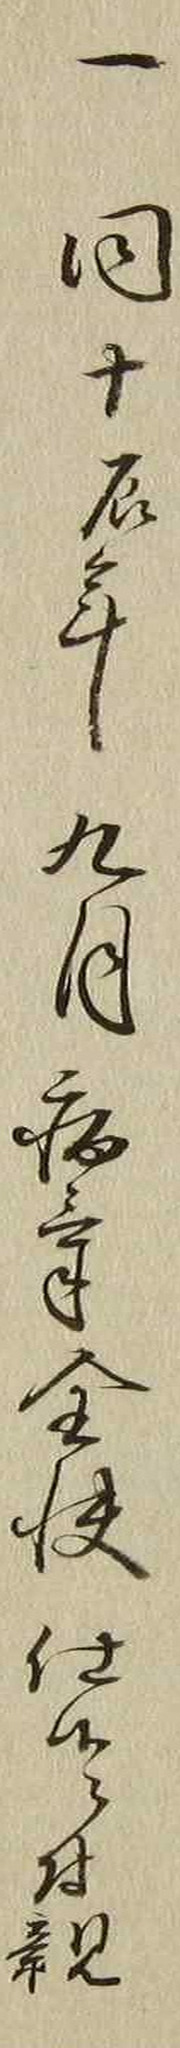一同十辰年九月病気全快仕候ニ付親
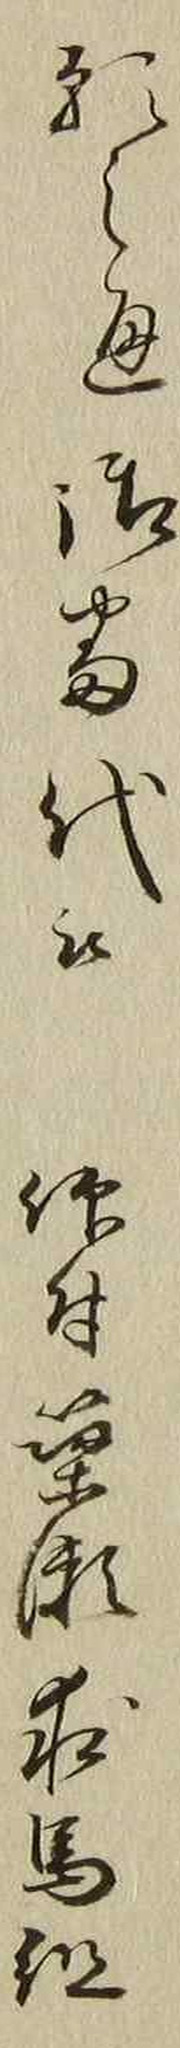願之通御番代被仰付簗瀬求馬組
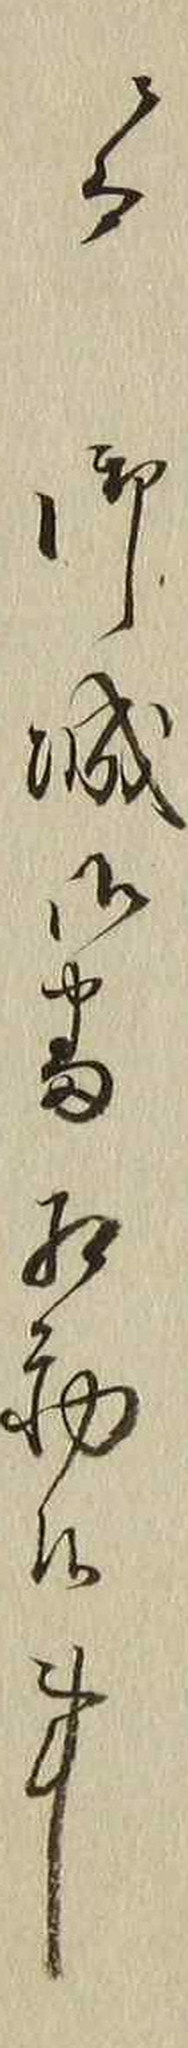ニ而御城御番相勤候事
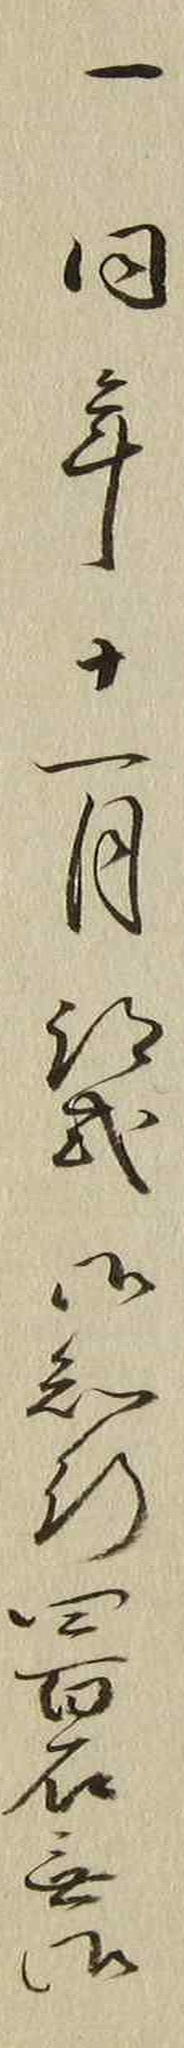一同年十一月跡式御知行四百石無御
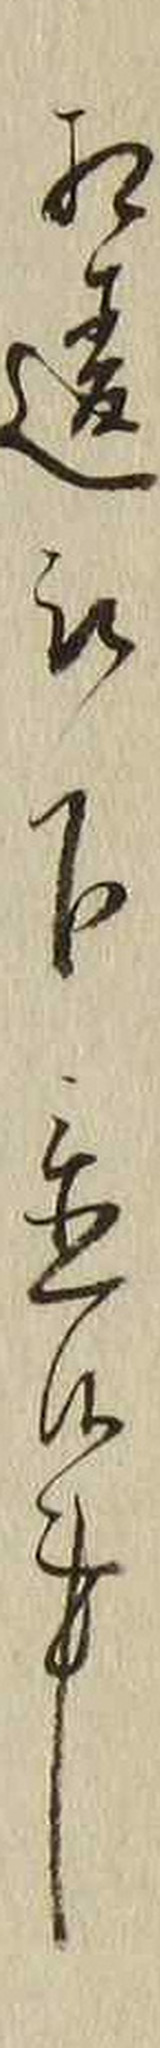相違被下置候事
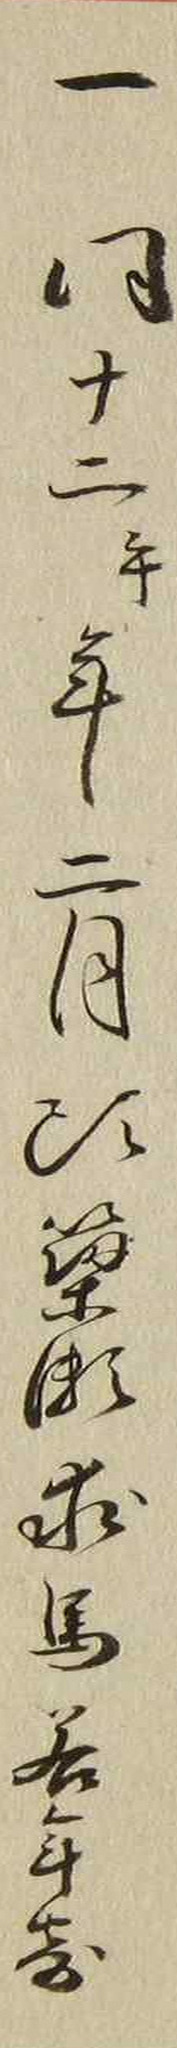一同十二午年二月頭簗瀬求馬若年寄
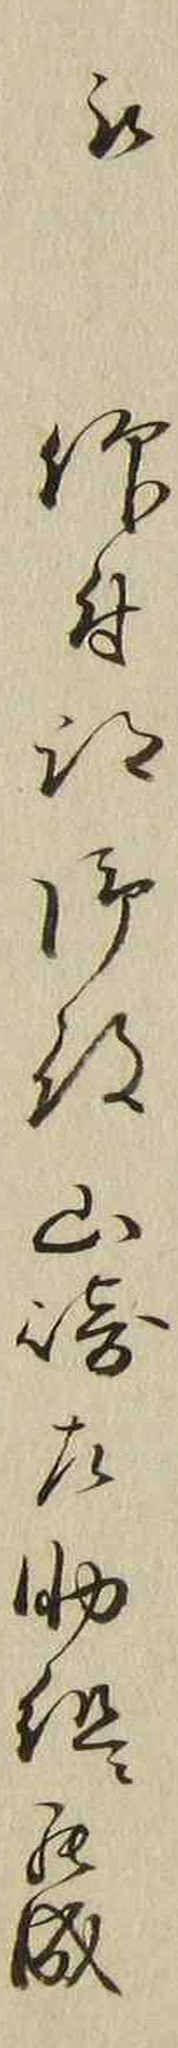被仰付跡御役山崎左助組ニ罷成

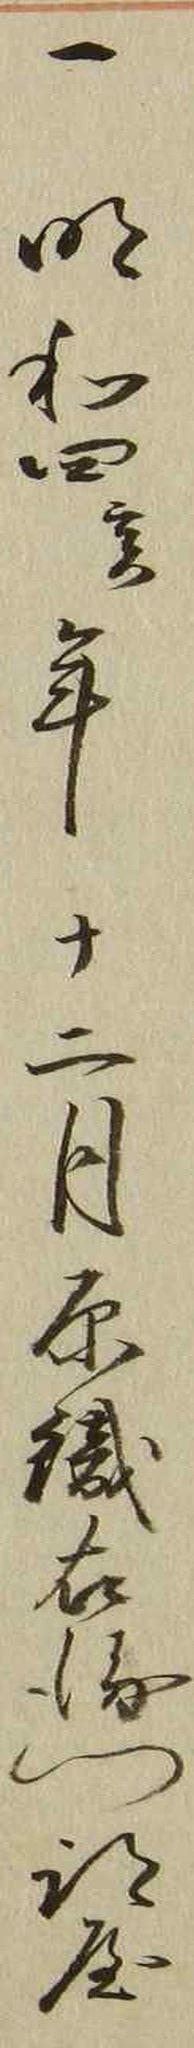一明和四亥年十二月原織右衛門跡屋
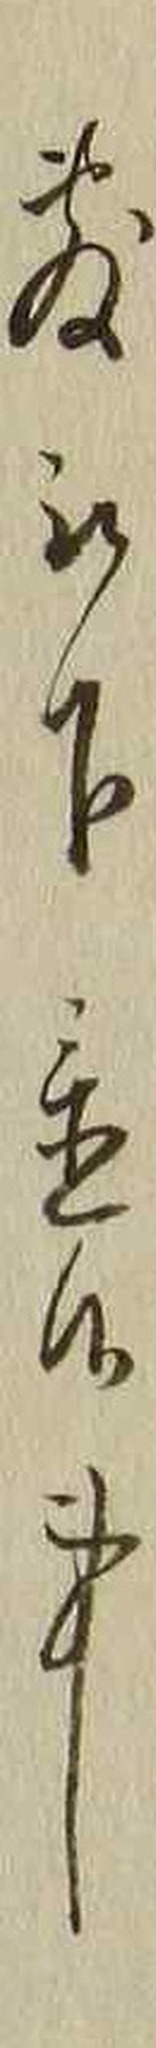敷被下置候事
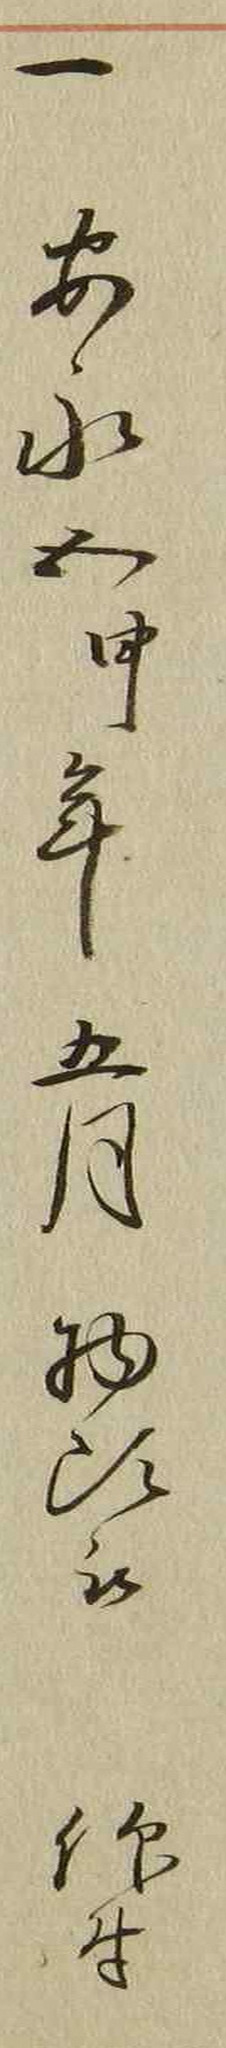一安永五申年五月物頭被仰付
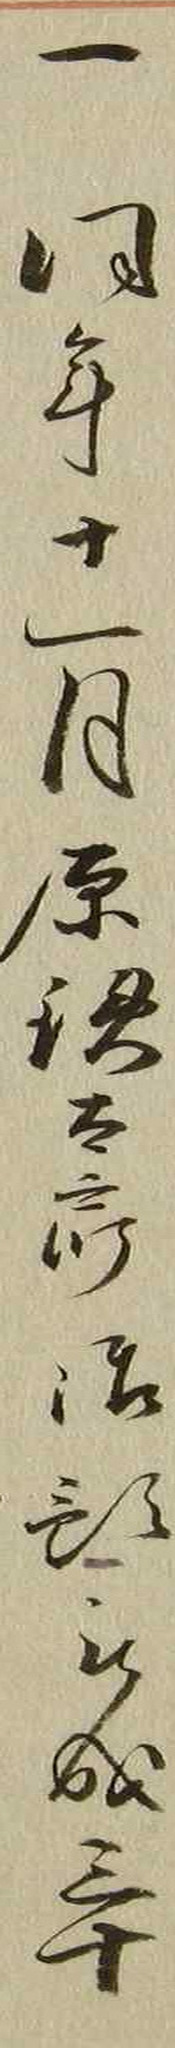一同年十一月原鉄太郎御預被成三十
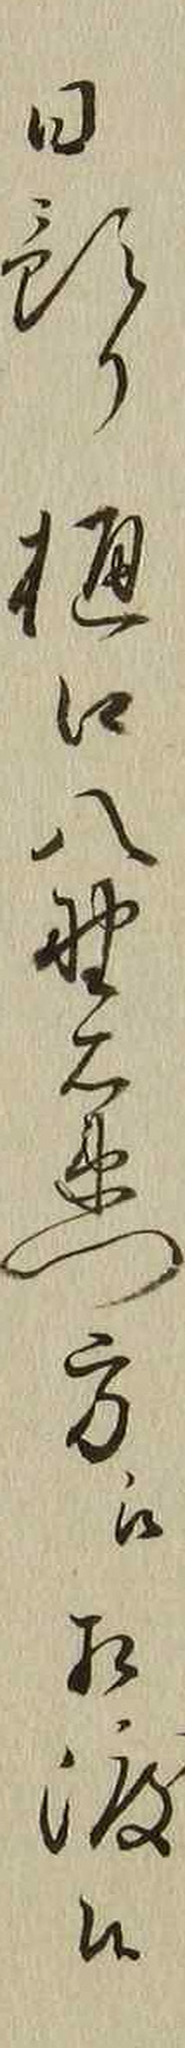日預り樋口八野右衛門方江相渡候
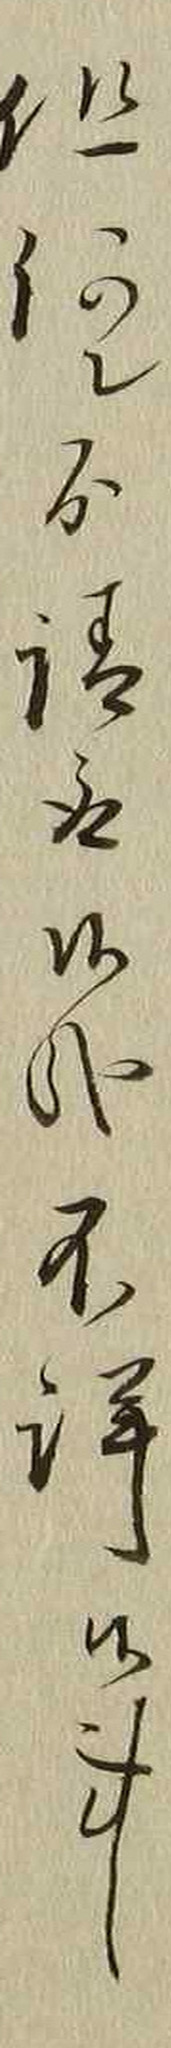但何レゟ請取候哉不詳候事
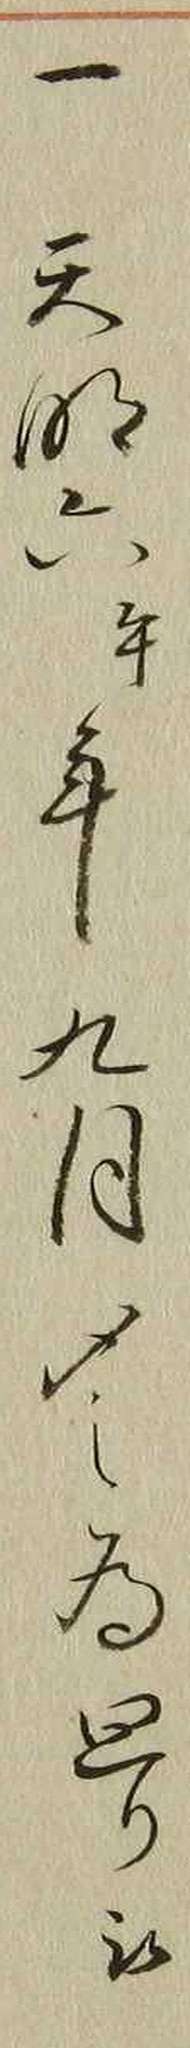一天明六午年九月〆之為廻り被
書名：諸士系譜　巻之68　を之部2
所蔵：会津若松市立会津図書館
